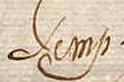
Temp.
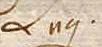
Lug.
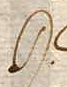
R.
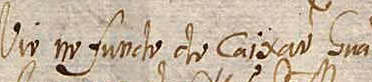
Vio no fundo do Caixaõ huã
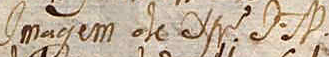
Imagem de Xp.o S̄. N.
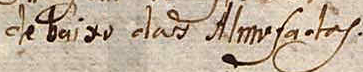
debaixo das Almofadas.
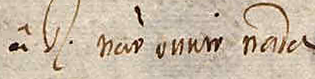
a R. naõ ouuio nada
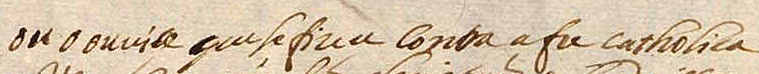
ou o ouuise que se fizece contra a fee catholica
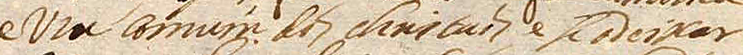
e vzo comum dos christaõs e se o deixar
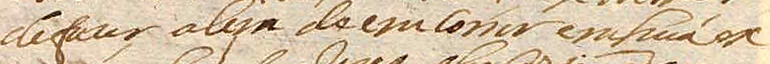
de fazer alem de emcorrer em huā ex
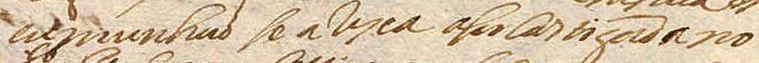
cumunhaõ se aRisca a ser castigada no
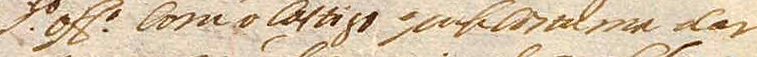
s.o off.o com o castigo que se costuma dar
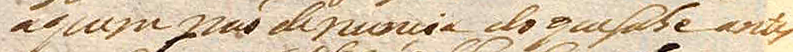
a quem naõ denuncia do que sabe antes
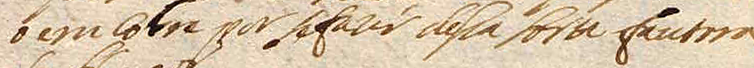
o emcobre por se fazer dessa sorte fautora
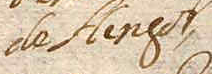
de Hereges,
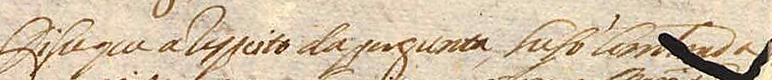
Disse que a Respeito da pergunta he so Conteuda
